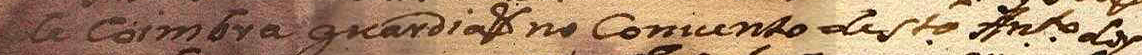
de Coimbra guardiaõ no Conuento de s.to An.to dos
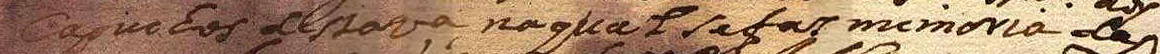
Capuchos desta va, na qual se faz memoria das
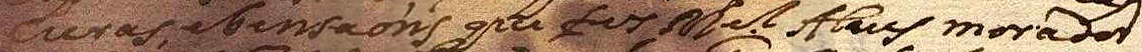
curas, e bensaõns que fes Me.l Alaues morador
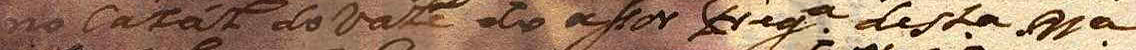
no Cazal do VaLe do assor freg.a de sta M.a
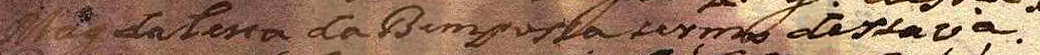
Magdalena da Bemposta termo desta va.
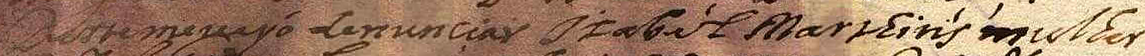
deste me ueyo denunciar Izabel Marthin̄s mulher
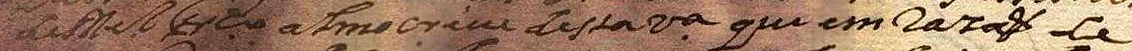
de Me.l Fr.co almocreue desta v.a que em razaõ de
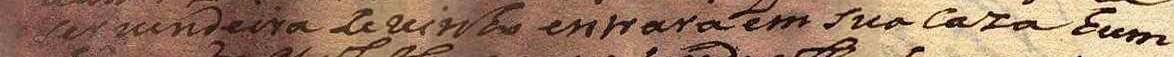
ser uendeira de uinho entrara em sua caza hum
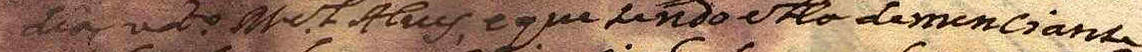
dia o d̄o Me.l Alues, e que tendo ella denunciante
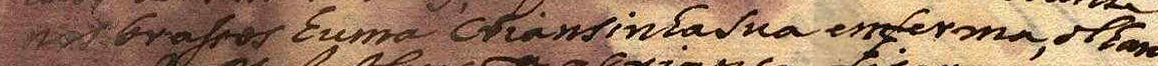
nos brassos huma criansinha sua enferma, olhan
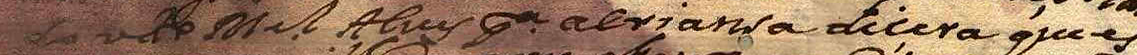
do o d̄o Me.l Alues p.a a criansa diçera que es
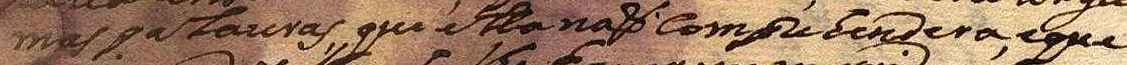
mas palauras que ella naõ comprehendera, e que
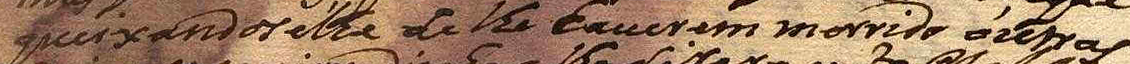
queixandoselhe de lhe hauerem morrido outras
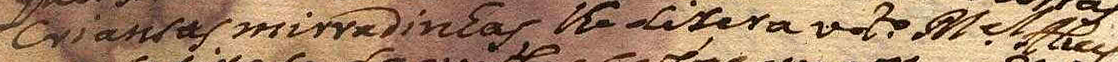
Criansas mirradinhas, lhe dicera o d̄.o M.el Alues
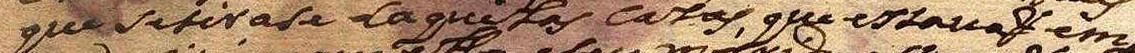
que se tirase daquellas cazas, que estauaõ em
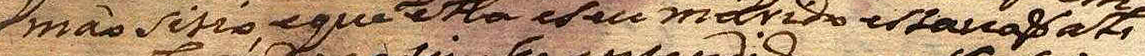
máo sitio, e que ella e seu marido estauaõ aLi
